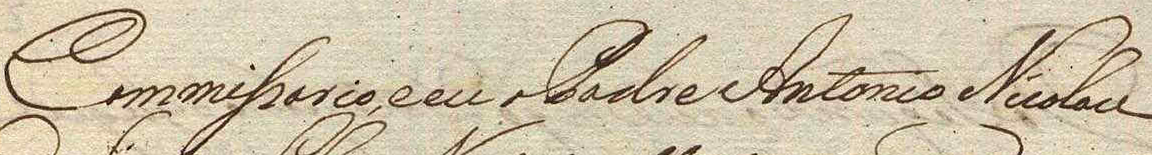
Commissario, e eu o Padre Antonio Nicolau
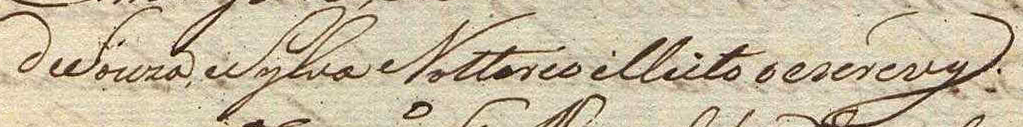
de Souza, e Sylva Nottario illeito o escrevy.
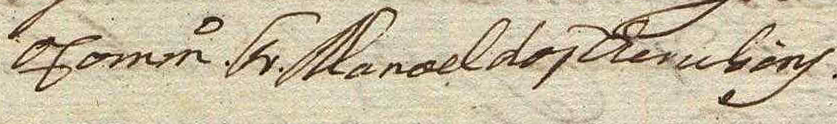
o Comm.o Fr. Manoel dos Cherubins.
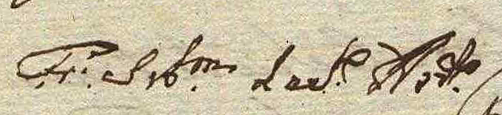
Fr.co Seb.m de S.to Ant.o
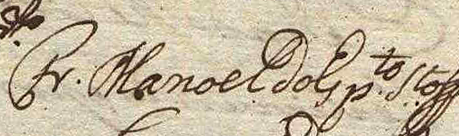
Fr. Manoel do Esp.to s.to
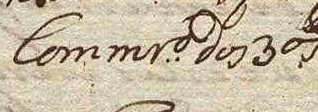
Commr.o dos 3o.s
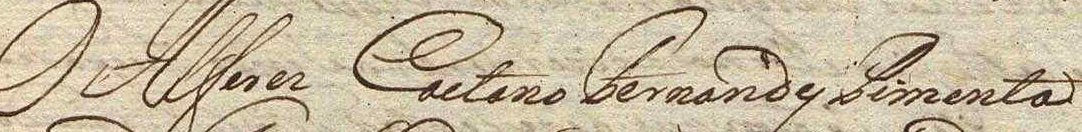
O Alferez Caeteno Fernandes Pimenta
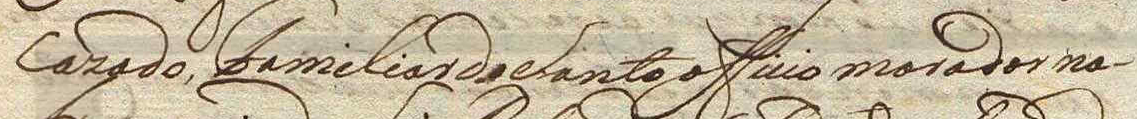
Cazado, Familiar do Santo officio morador na
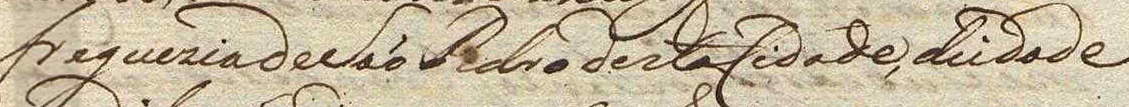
freguezia de Saõ Pedro desta Cidade, de idade
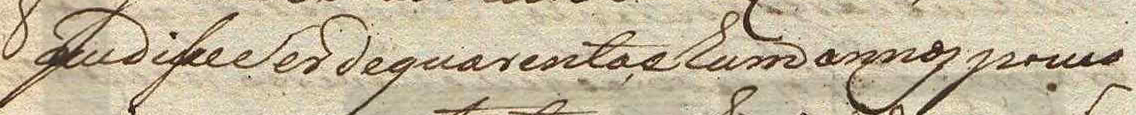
que disse ser de quarenta, e hum annos pouco
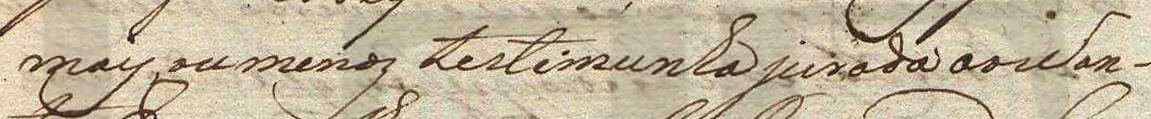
mais, ou menoz testemunha jurada aos San
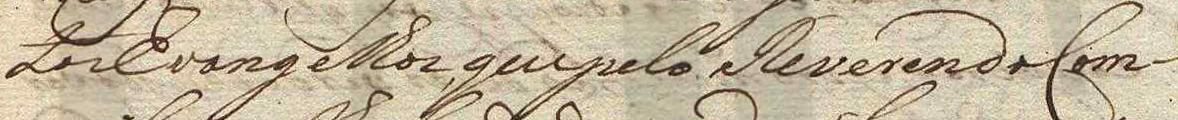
tos Evangelhos, que pelo Reverendo Com
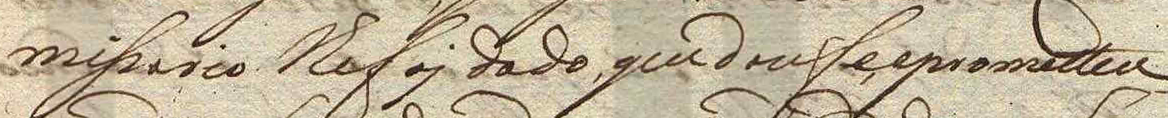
missario lhe foj dado, que dou fe, e prometteu
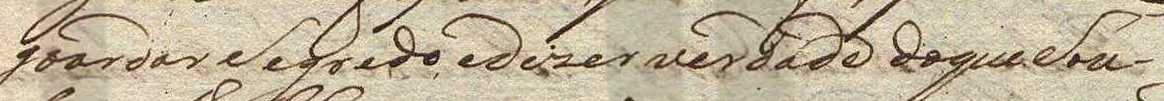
goardar Segredo, e dizer verdade do que Sou
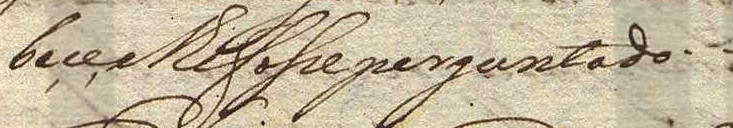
beçe, e lhe fosse perguntado.
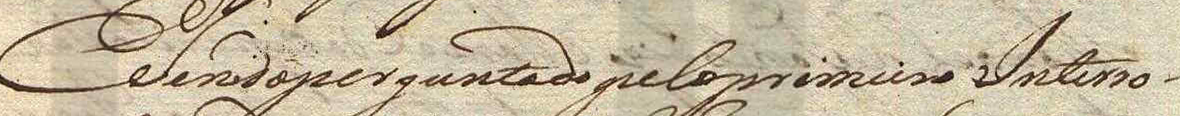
E Sendo perguntado pelo primeiro Interro
